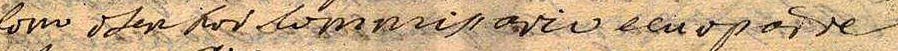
com o senhor commissario e eu o padre
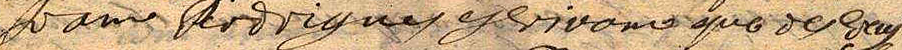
Joam Rodrigues escrivam que o escreuj
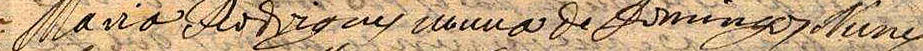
Maria Rodrigues uiuua de Domingos Nunes
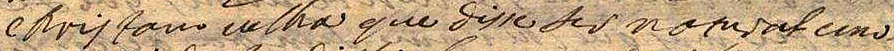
christam uelho que disse ser natural e mo
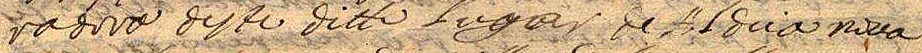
radora deste ditto lugar de Aldeia noua
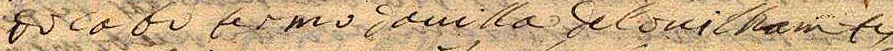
do cabo termo da uilla de Couilham tes
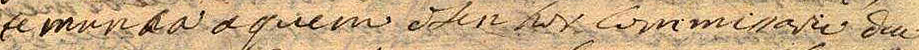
temunha a quem o senhor commissario deu
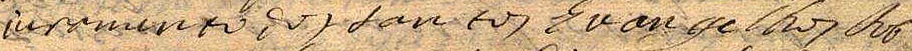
iuramento dos santos Euangelhos sob
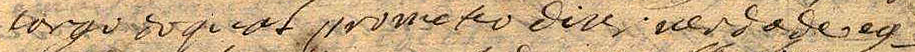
cargo do qual prometeo dizer uerdade e g
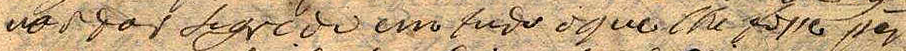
uardar segredo em tudo o que lhe fosse per
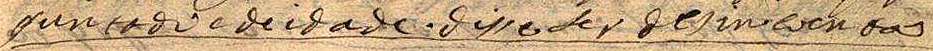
guntado e de idade. disse ser de sincoenta
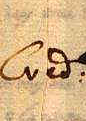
Credo.
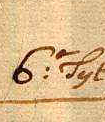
6:a Testa.
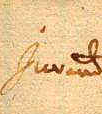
Juramto.
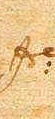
Jde:
